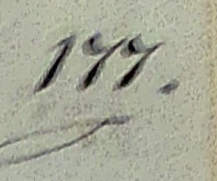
177.
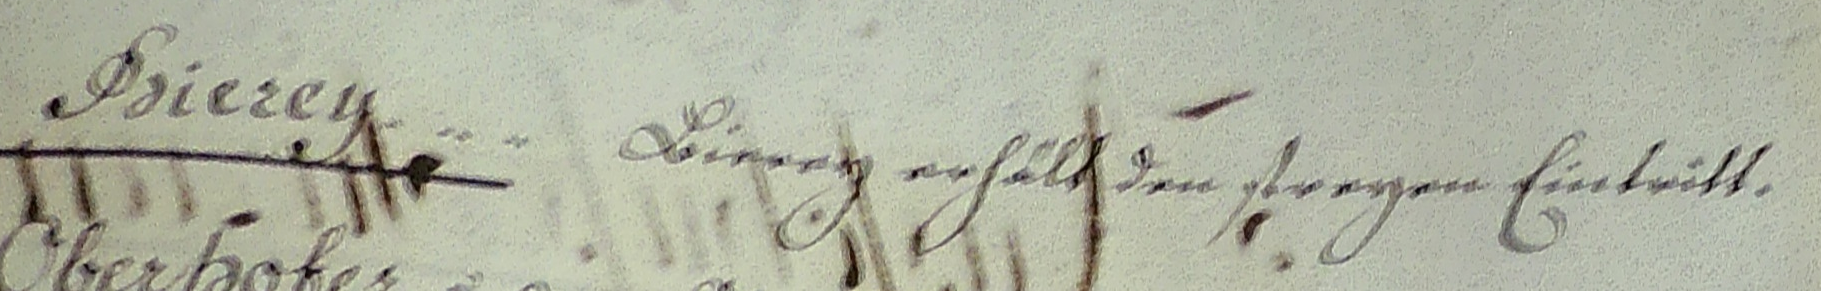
Bierey. .. .. Bierey erhält den freyen Eintritt.
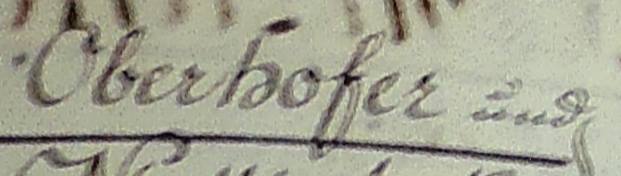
Oberhofer und
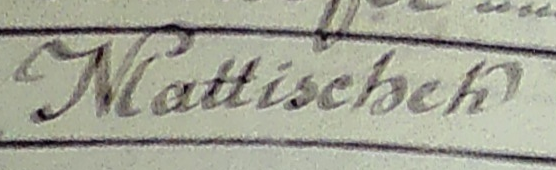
Mattischek.
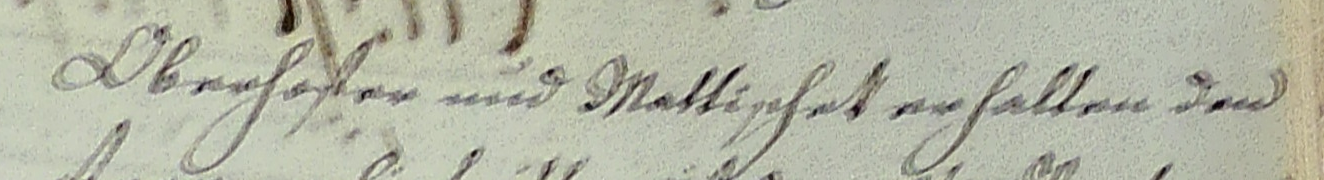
Oberhofer und Mattischek erhalten den
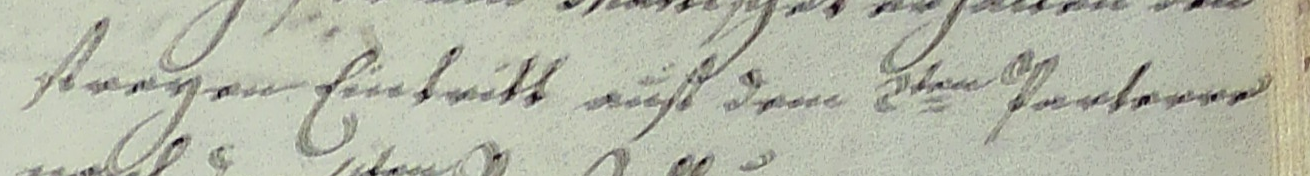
freyen Eintritt auf dem 2te͇n Parterre
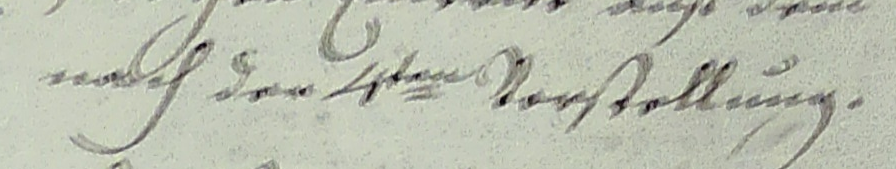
nach der 4te͇n Vorstellung.
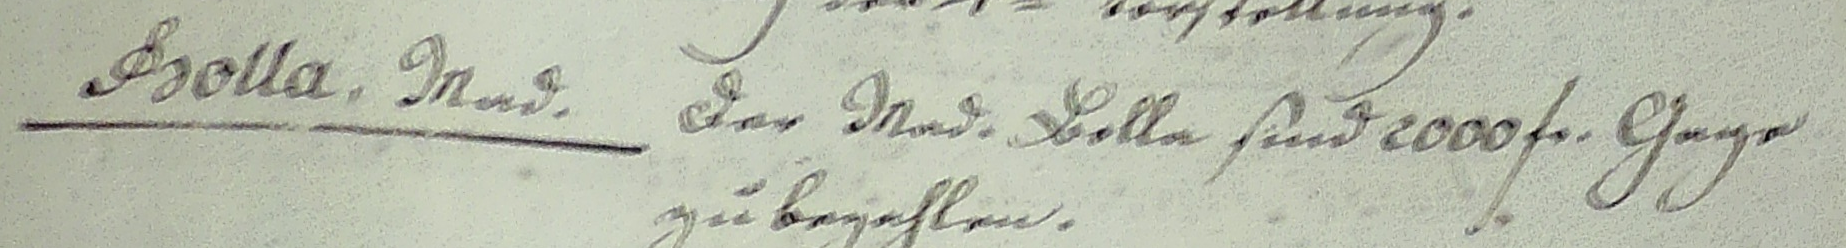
Bolla, Mad. Der Mad. Bolla sind 2000fr. Gage
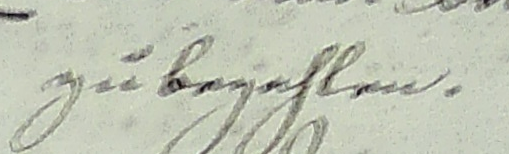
zu bezahlen.
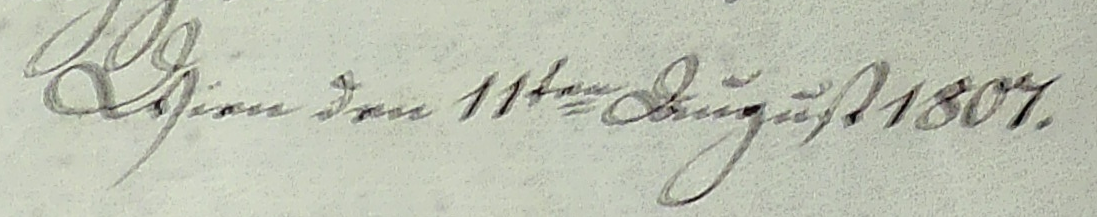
Wien den 11te͇n August 1807.
